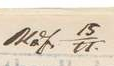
An den h.
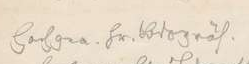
Hochgea.Hr. Bdspräs.
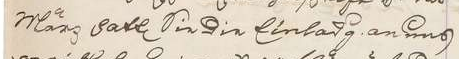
März hatten Sie die Einlad[un]g an uns
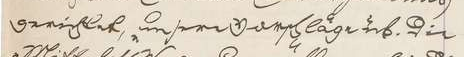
gerichtet, «unsere Vorschläge üb. die
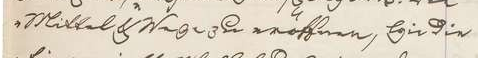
Mittel & Wege zu eröffnen, wie die
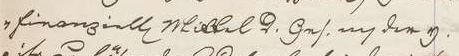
finanziellen Mittel d.Ges. mit der v.
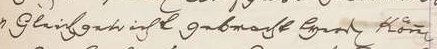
Gleichgewicht gebracht werden könne».
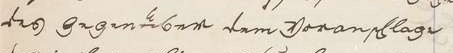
des gegenüber dem Voranschlage
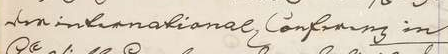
der internationalen Conferenz in
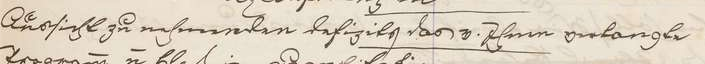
Aussicht zu nehmenden Defizits das v. Ihnen verlangte
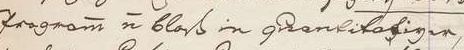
Programm nicht bloß in quantitativer,
